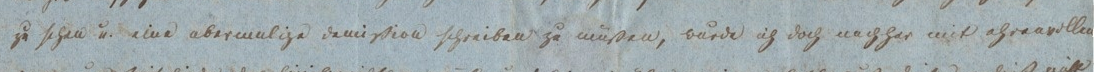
zu sehen u. eine abermalige Demission schreiben zu müssen, wurde ich doch nachher mit ehrenvollem
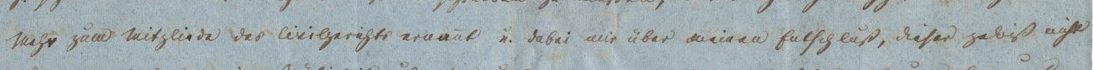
Mehr zum Mitgliede des Civilgerichts ernannt u. dabei mir über meinen Entschluß, dieser gewiß nicht
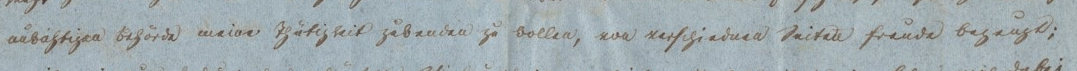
unwichtigen Behörde meine Thätigkeit zuwenden zu wollen, von verschiednen Seiten Freude bezeugt;
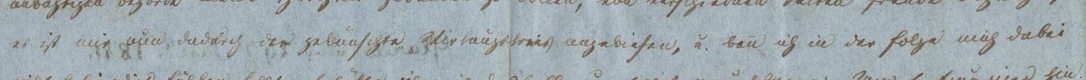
es ist mir nun dadurch der gewünschte Wirkungskreis angewiesen, u. wenn ich in der Folge mich dabei
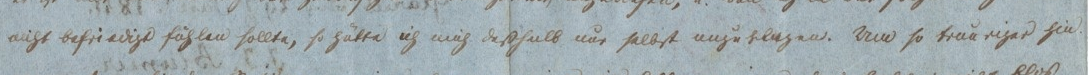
nicht befriedigt fühlen sollte, so hätte ich mich deßhalb nur selbst anzuklagen. Um so trauriger hin-
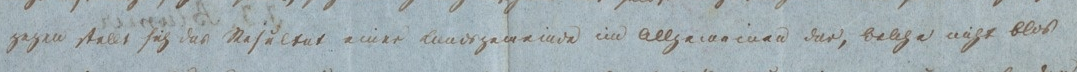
gegen stellt sich das Resultat einer Landsgemeinde im Allgemeinen dar, welche nicht blos
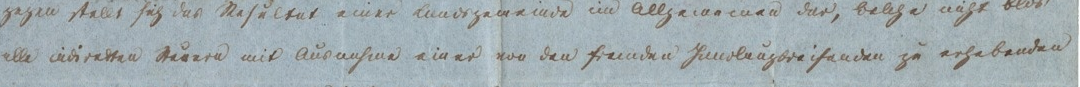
alle indirekten Steuern mit Ausnahme einer von den fremden Handlungsreisenden zu erhebenden
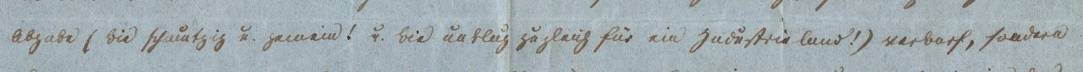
Abgabe (wie schmutzig u. gemein! u. wie unklug zugleich für ein Industrieland!) verwarf, sondern
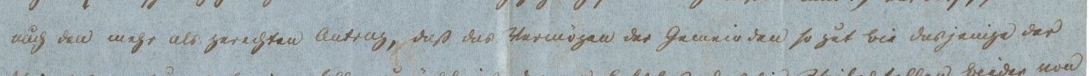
auch den mehr als gerechten Antrag, daß das Vermögen der Gemeinden so gut wie dasjenige der
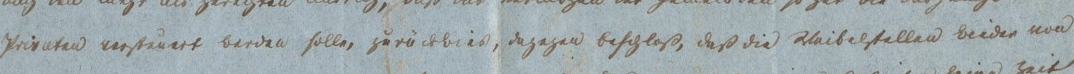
Privaten versteuert werden solle, zurückwies, dagegen beschloß, daß die Weibelstellen wieder von
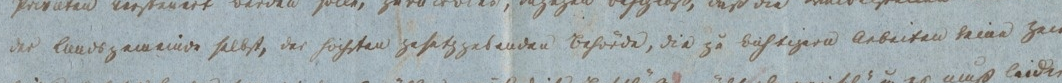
der Landsgemeinde selbst, der höchsten gesetzgebenden Behörde, die zu wichtigern Arbeiten keine Zeit
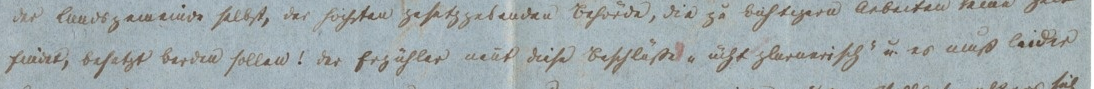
findet, besetzt werden sollen! Der Erzähler nennt diese Beschlüsse «ächtglarnerisch» u. es muß leider
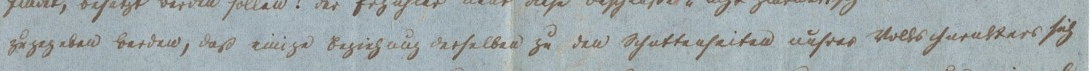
zugegeben werden, daß einige Beziehung derselben zu den Schattenseiten unsres Volkscharakters sich
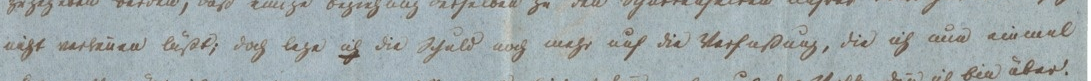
nicht verkennen läßt; doch lege ich die Schuld noch mehr auf die Verfassung, die ich nun einmal
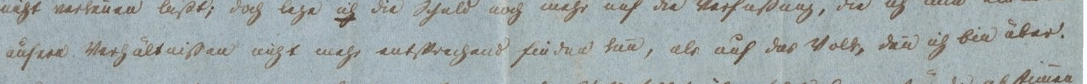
unsern Verhältnissen nicht mehr entsprechend finden kann, als auf das Volk, denn ich bin über-
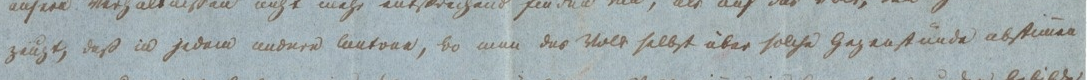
zeugt, daß in jedem andern Cantone, wo man das Volk selbst über solche Gegenstände abstimmen
